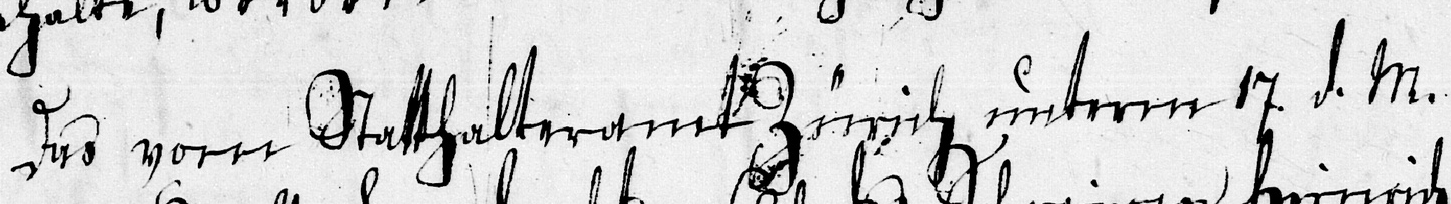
Das vom Statthalteramt Zürich unterm 17. d. M.
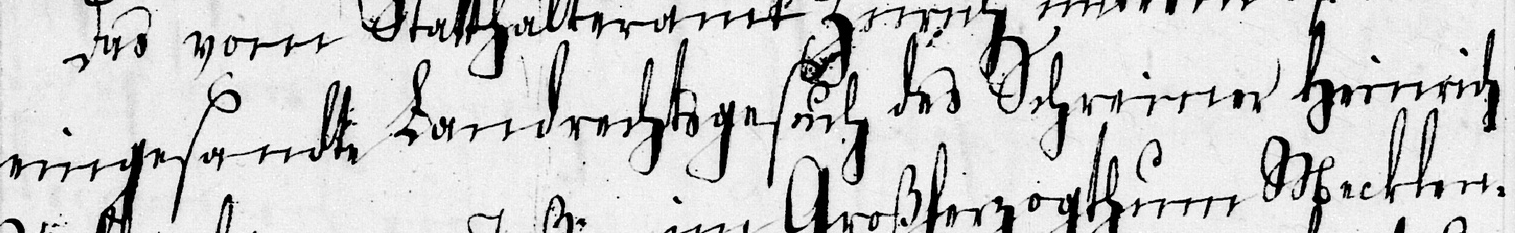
eingesandte Landrechtsgesuch des Schreiner Heinrich
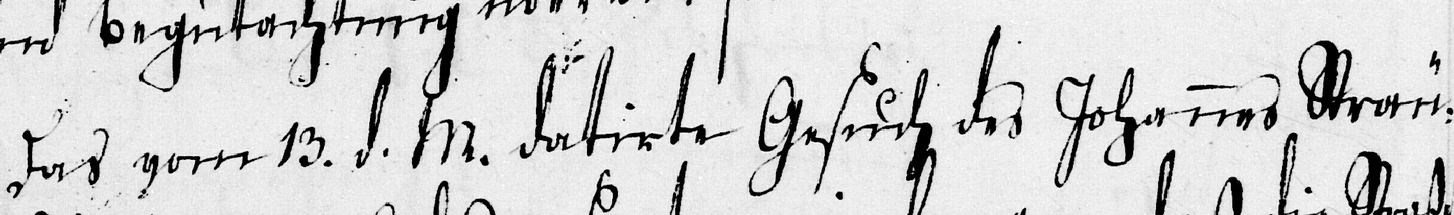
Das vom 13. d. M. datirte Gesuch des Johannes Sträu¬
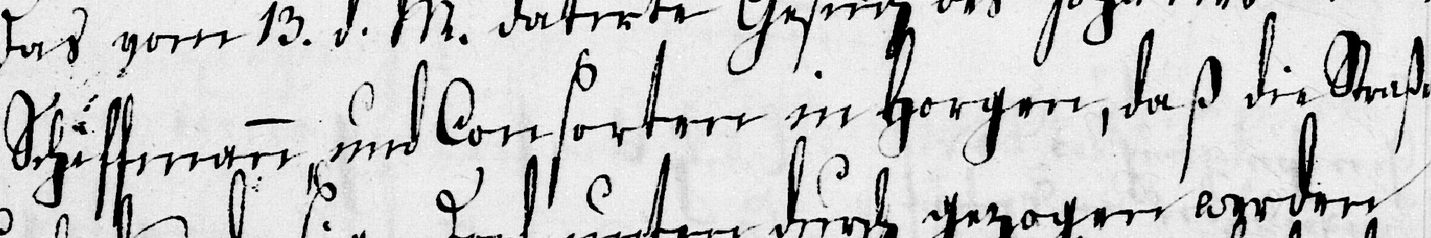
Schiffmann und Consorten in Horgen, daß die Straße
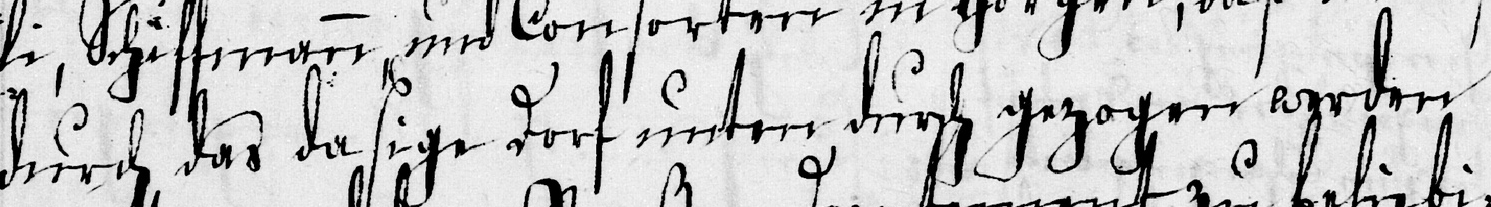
durch das dasige Dorf unten durch gezogen werden
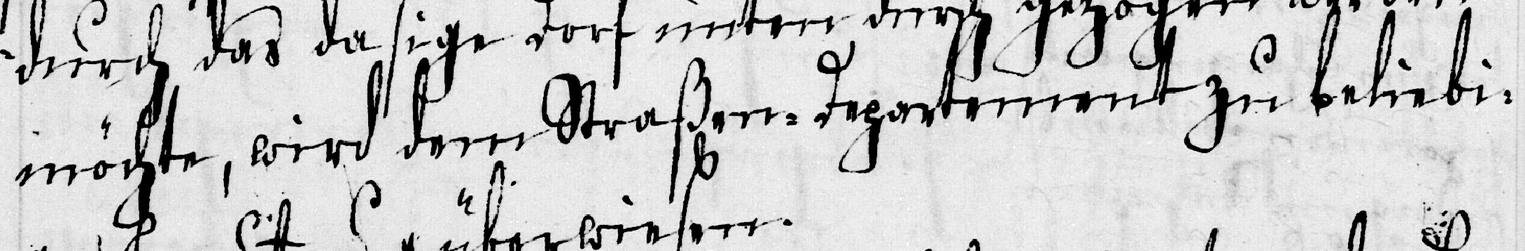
möchte, wird dem Straßen-Departement zu beliebi¬
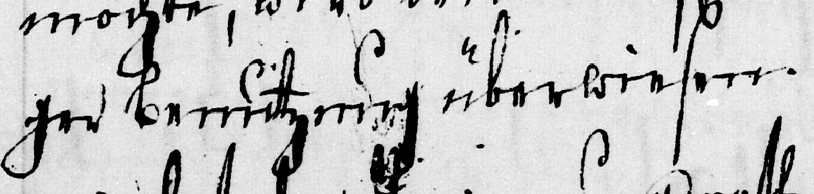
ger Benutzung überwiesen.
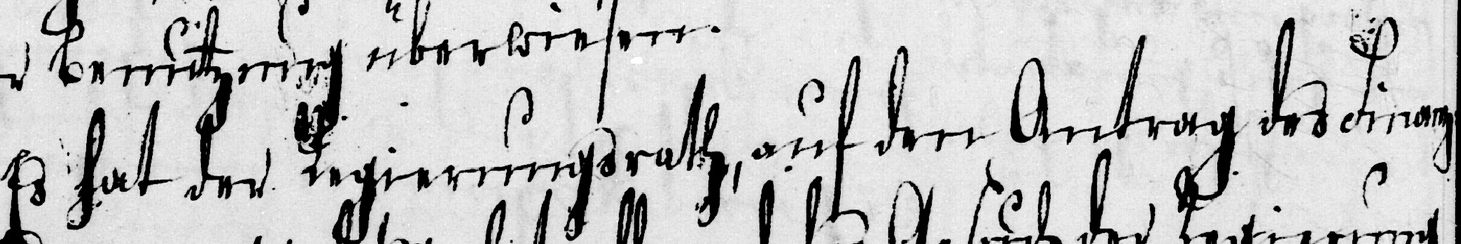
Es hat der Regierungsrath, auf den Antrag des Fina¬
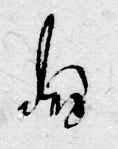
des
